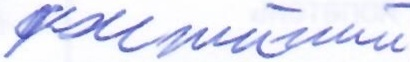каспийкий
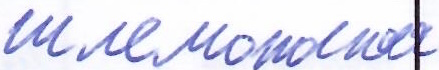шлемоносная
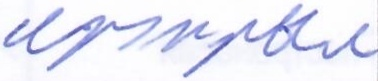сержрыл
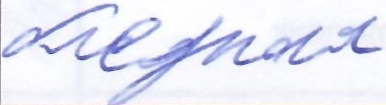бледная
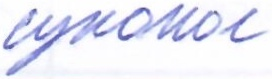сухонос
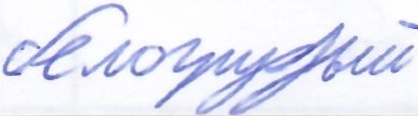белогрудый
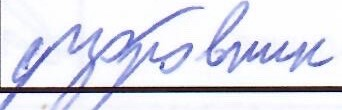дубровник
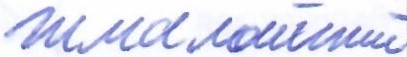гималайский
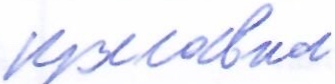крылавка
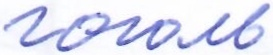гоголь
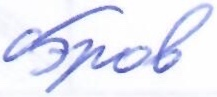бэров
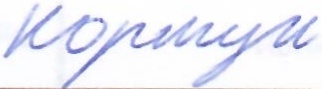коршун
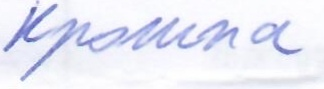крошпа
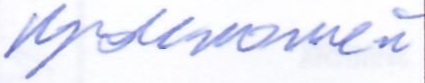красношей
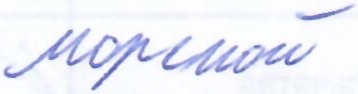морской
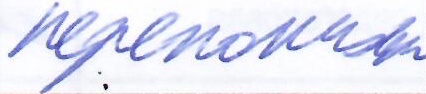перепончат
